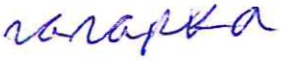гагарка
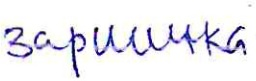зарничка
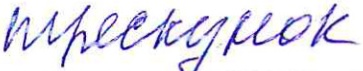трескунок
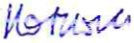конюга
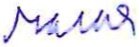малая
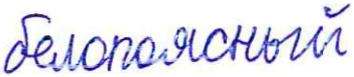белопоясный
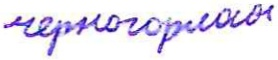черногорлая
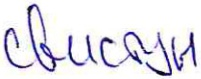свистун
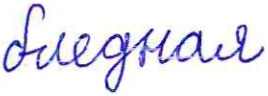бледная
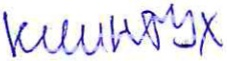клинтух
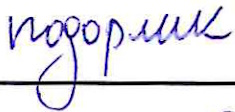подорлик
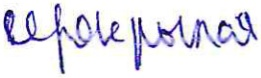серокрылая
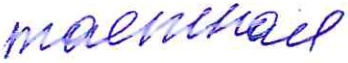таежная
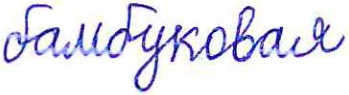бамбуковая
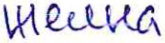желна
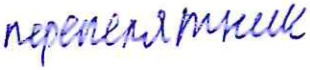перепелятник
